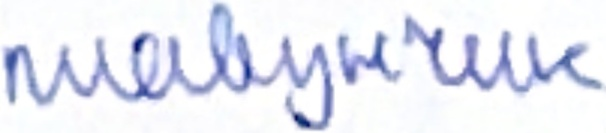плавунчик
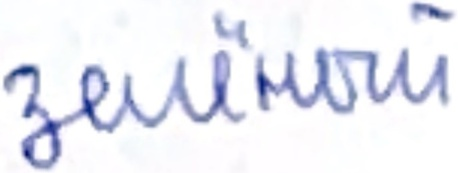зелёный
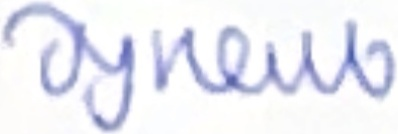дупель
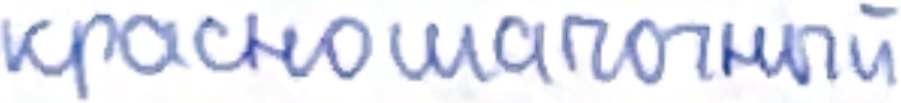красношапочный
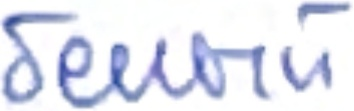белый
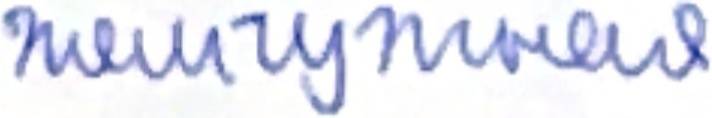жемчужная
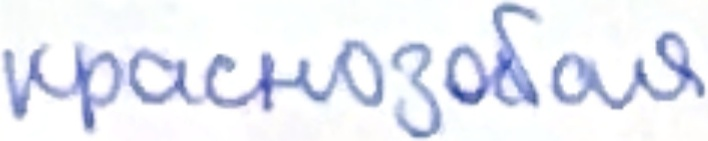краснозобая
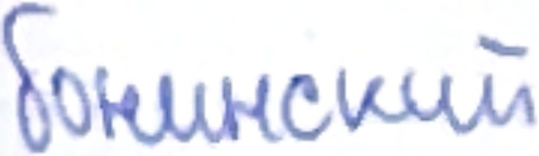бонинский
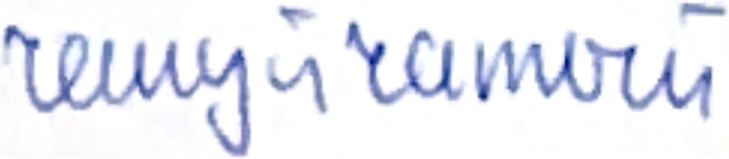чешуйчатый
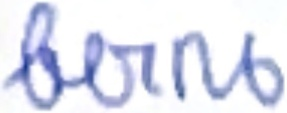выпь
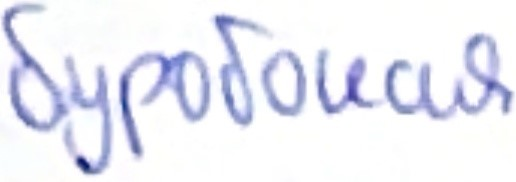буробокая
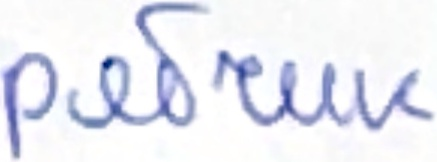рябчик
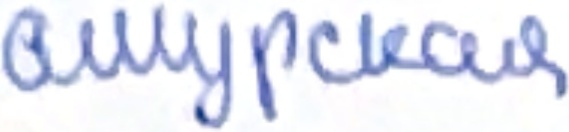амурская
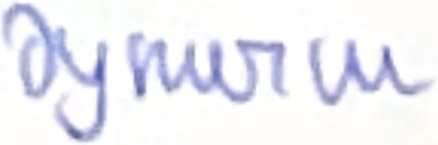дутыш
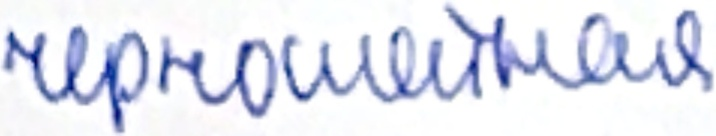черношейная
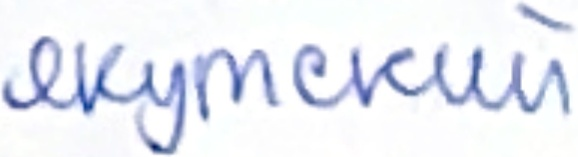якутский
